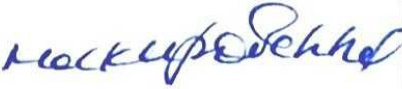москировення
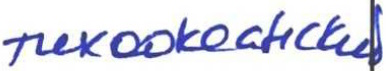тихоокеанский
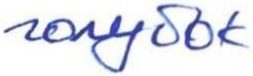голубок
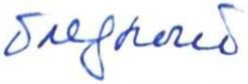бледный
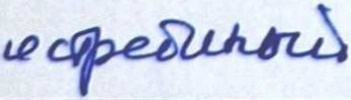ястребиный
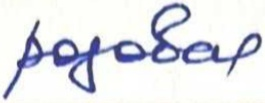розовая
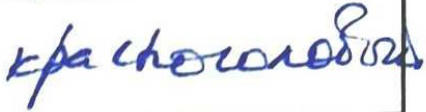красноголовый
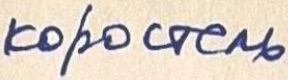коростель
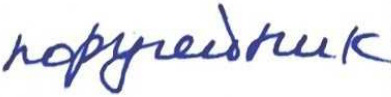поручейник
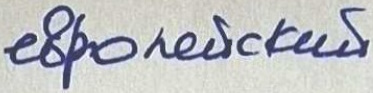европейский
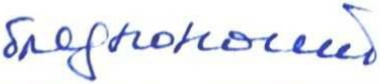бледноногий
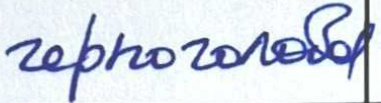черпоголовя
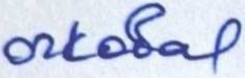очковая
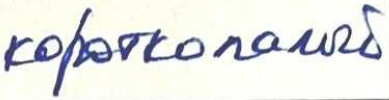короткопалый
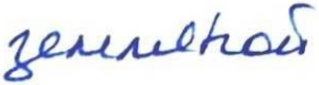земляной
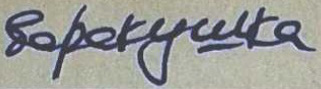ворекушка
